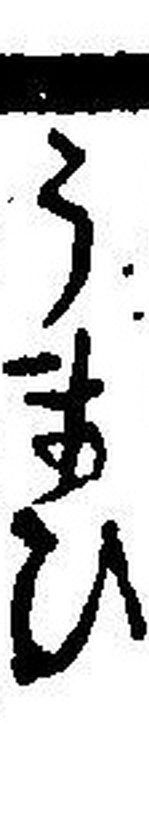うまひ
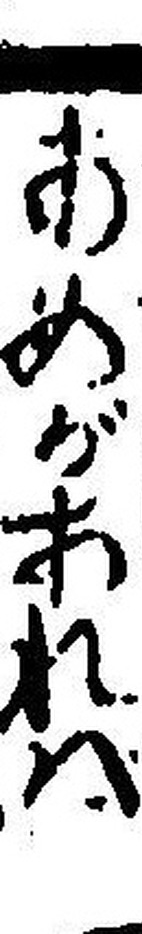あめがあれば
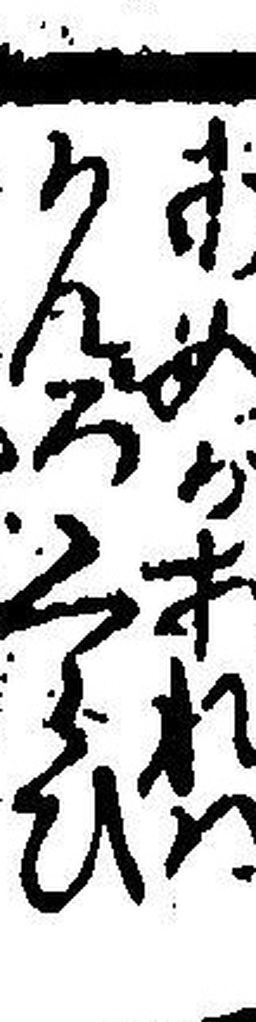かんろくらひ
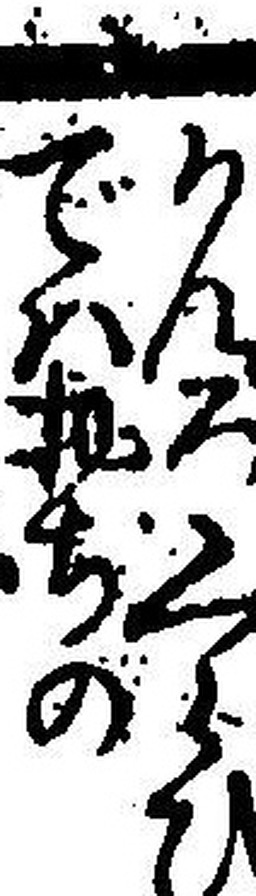ではおちの
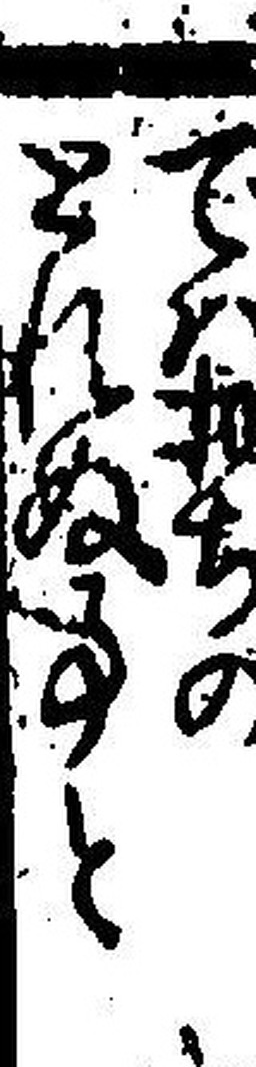とれぬ事と
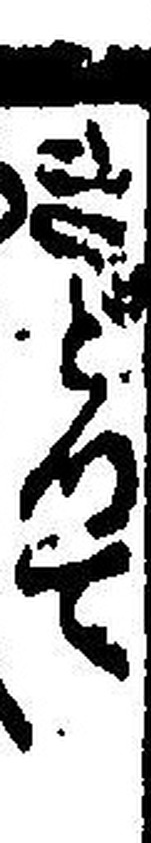きどつて
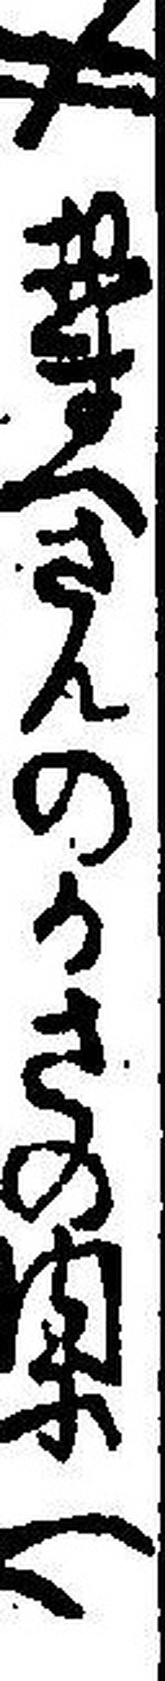おまへさんのかさの内に
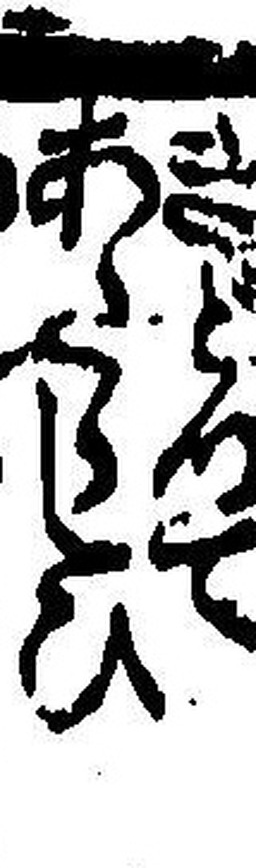あたらしひ
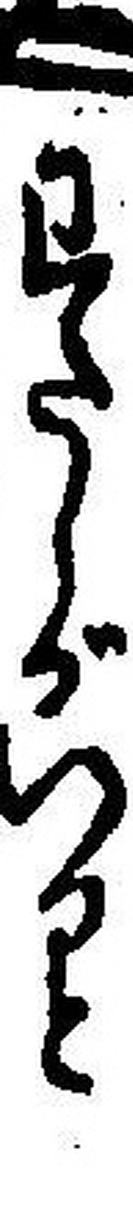わたしがいると
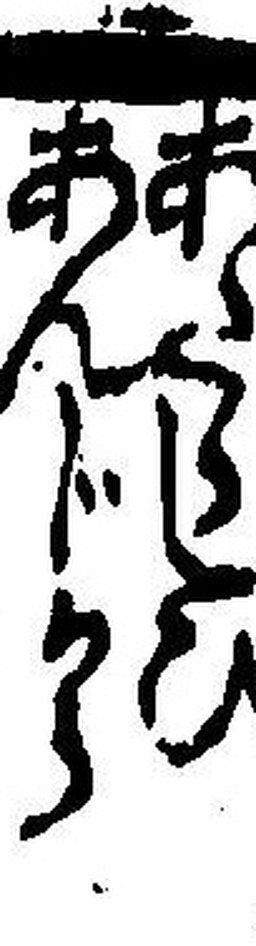あんじから
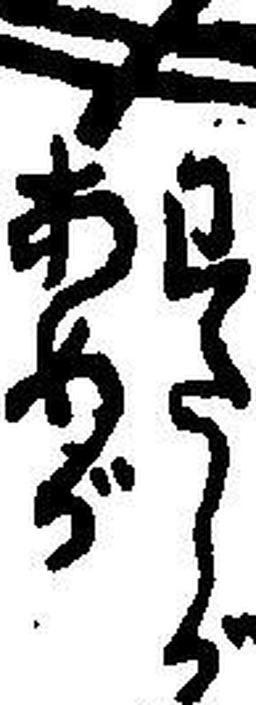あめが
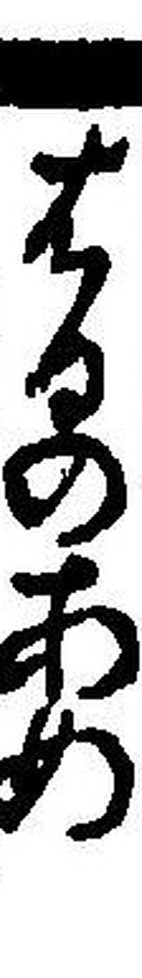はるのあめ
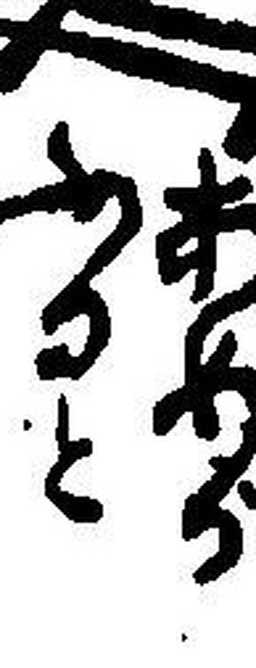ふると
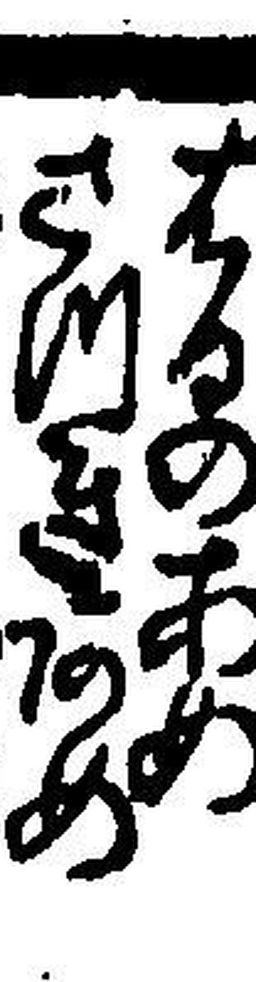さつきあめ
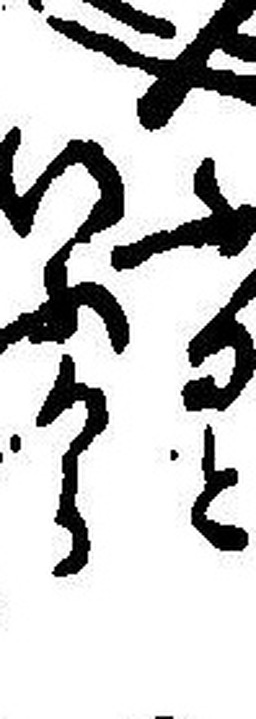いふから
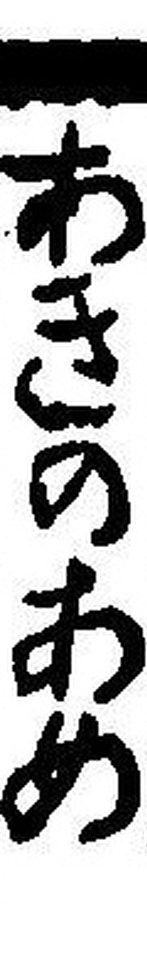あきのあめ
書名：徳若水縁起金性 / 樹下石上作
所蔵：東京大学総合図書館 General Library in the University of Tokyo, JAPAN
